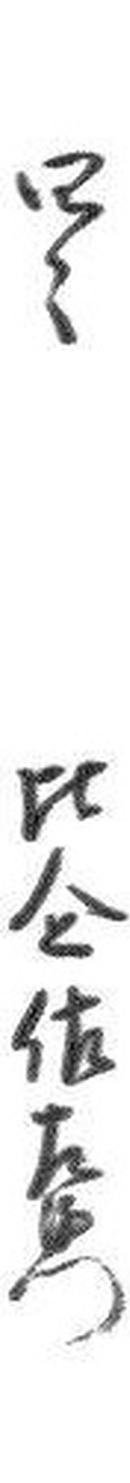四々比企佐左衛門
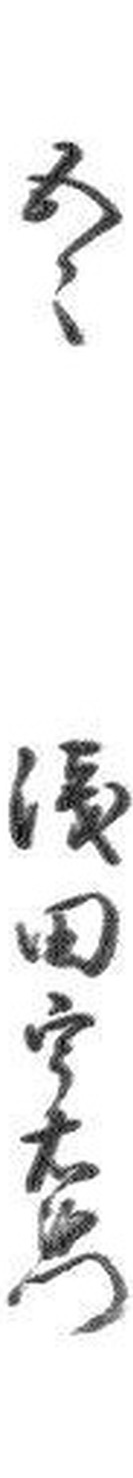五々浅田宇右衛門
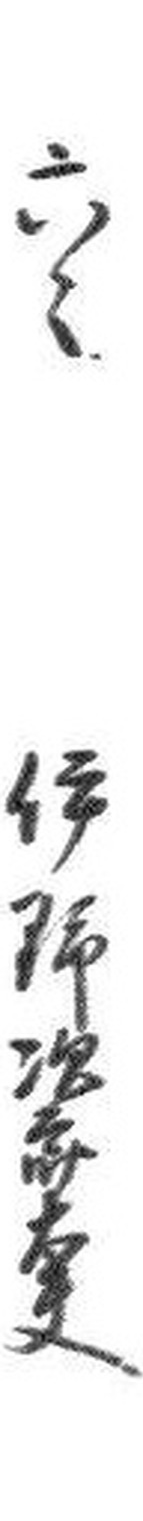六々伊野次郎太夫
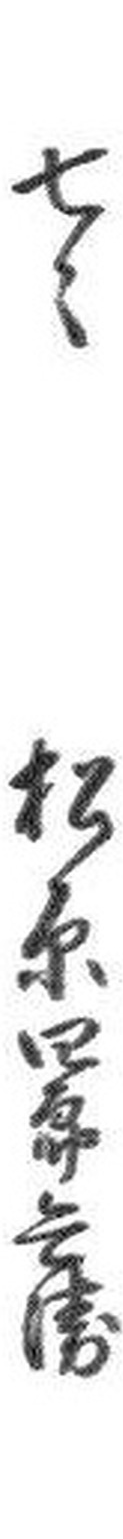七々松原四郎兵衛
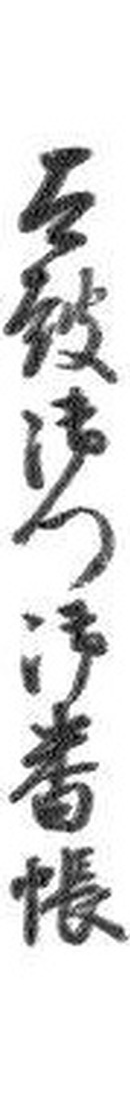太鼓御門御番帳

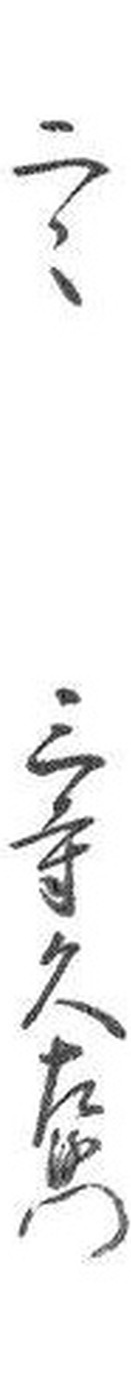二々三寺久左衛門
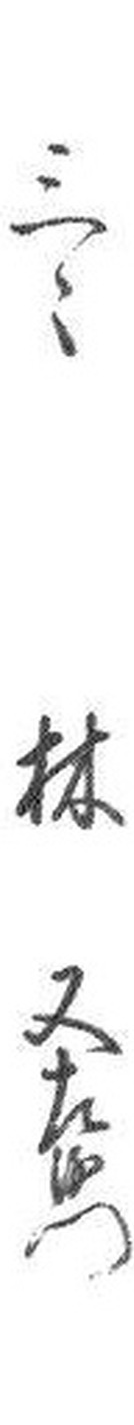三々林又左衛門
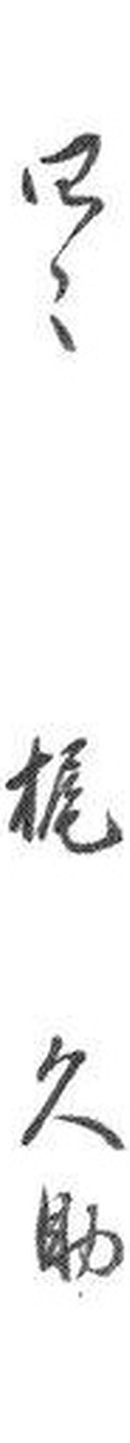四々梶久助
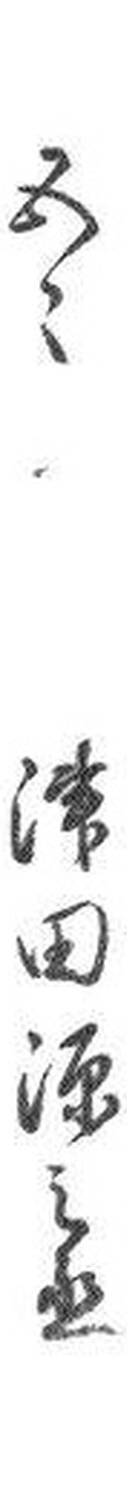五々津田源之丞
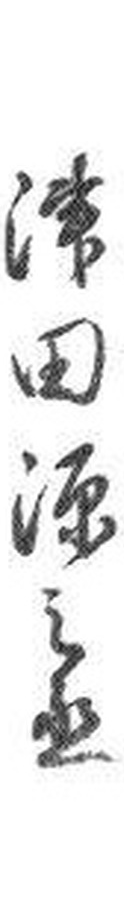五々津田源之丞
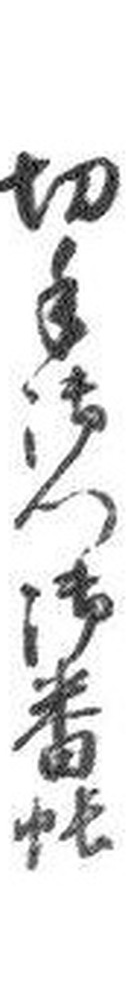切手御門御番帳
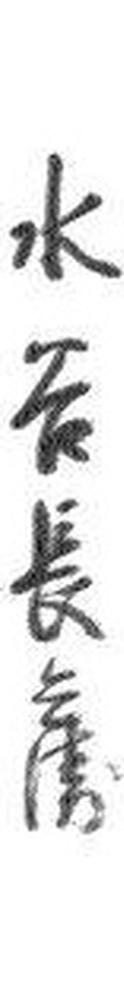一番水谷長兵衛
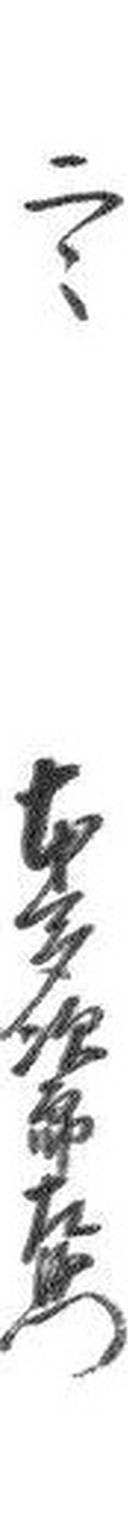二々本多次郎左衛門
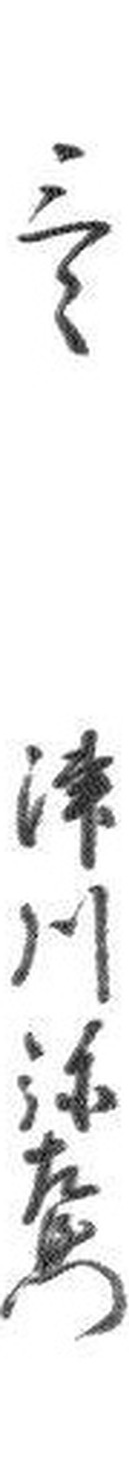三々津川弥左衛門
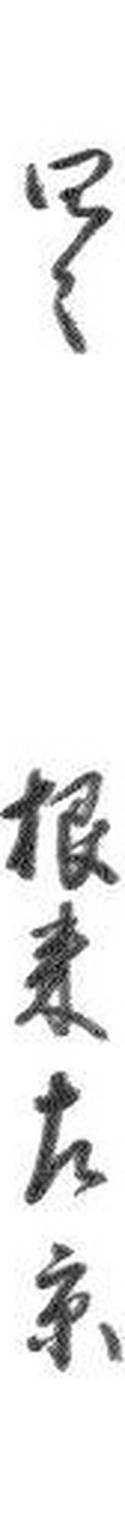四々根来左京
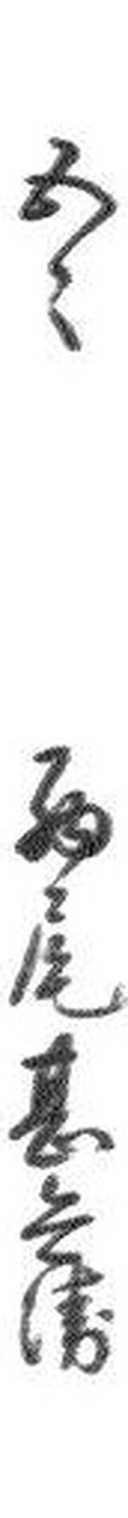五々西尾甚兵衛
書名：家譜 十一 昌親公 従延宝二年到延宝四年八月
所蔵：福井県文書館 Fukui Prefectural Archives
